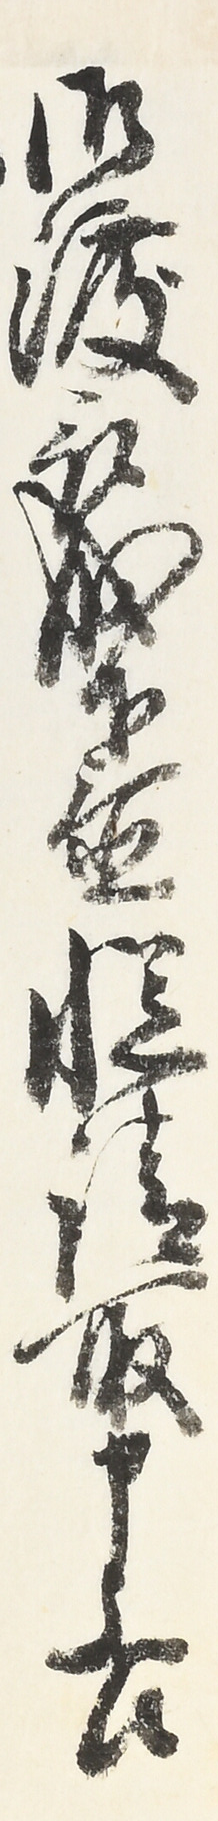御渡被成下置慥請取申上候
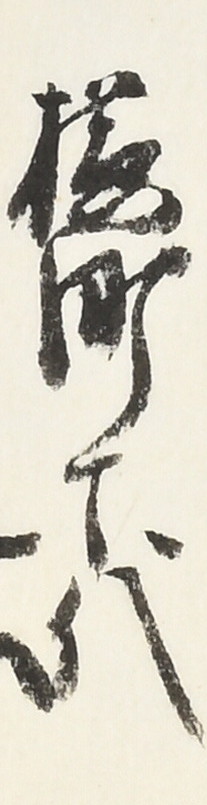横町丁代
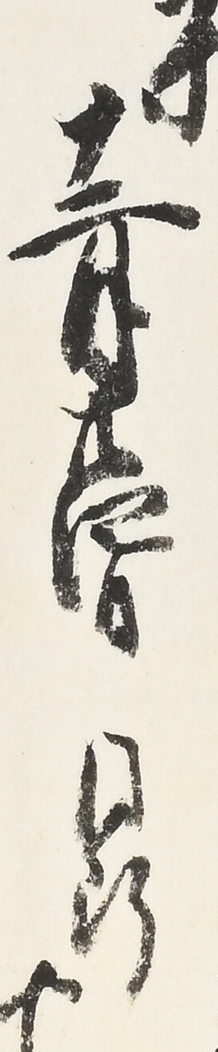十二月廿四日同断
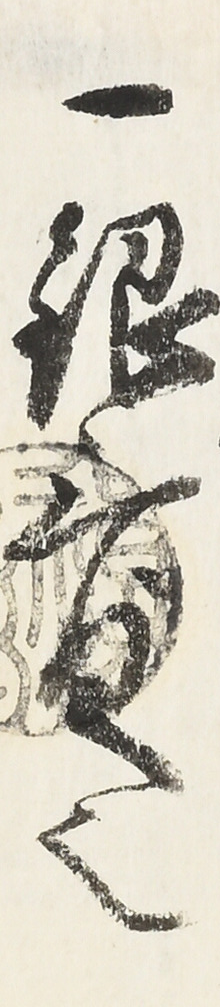一銀三匁也
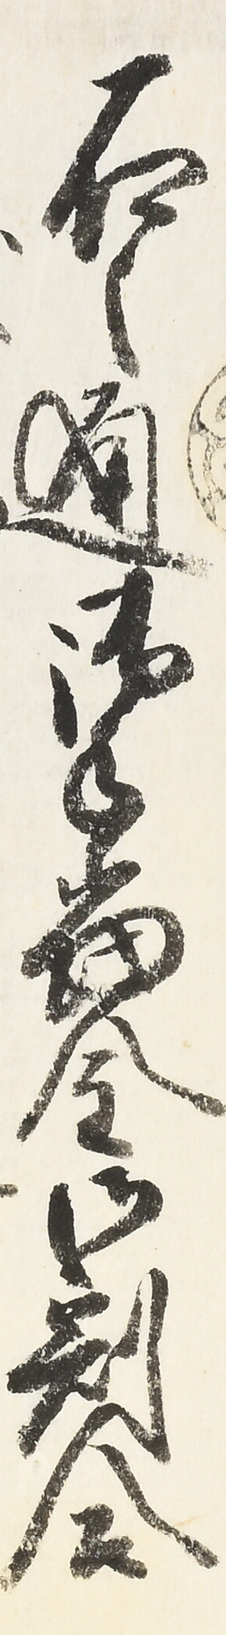右之通御手当金御割合
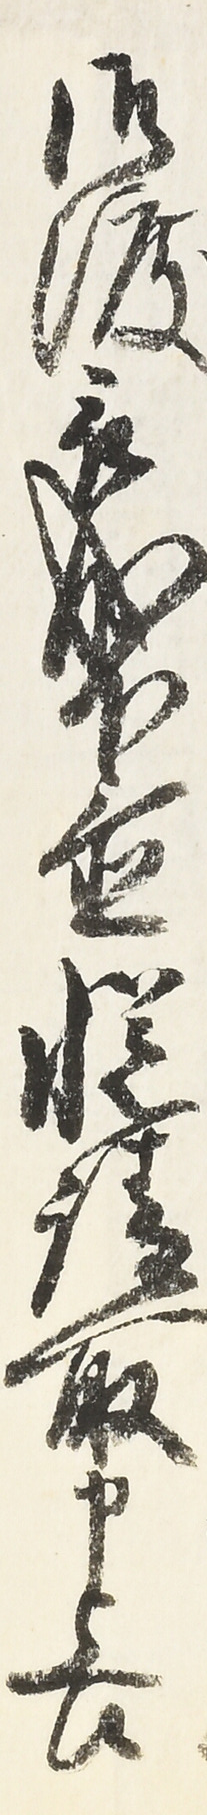御渡被成下置慥請取申上候
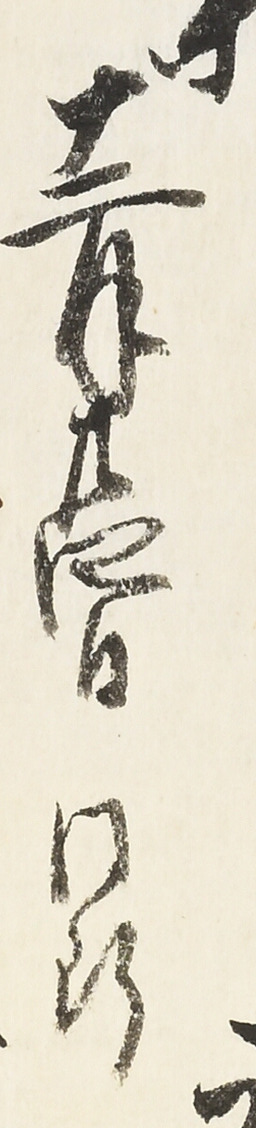十二月廿四日同断
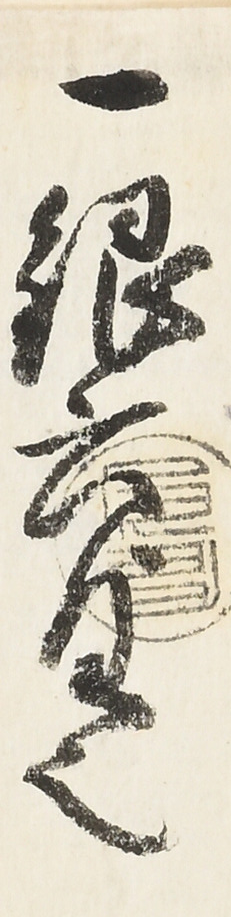一銀六匁也
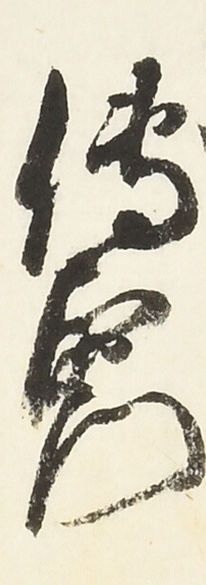伝右衛門
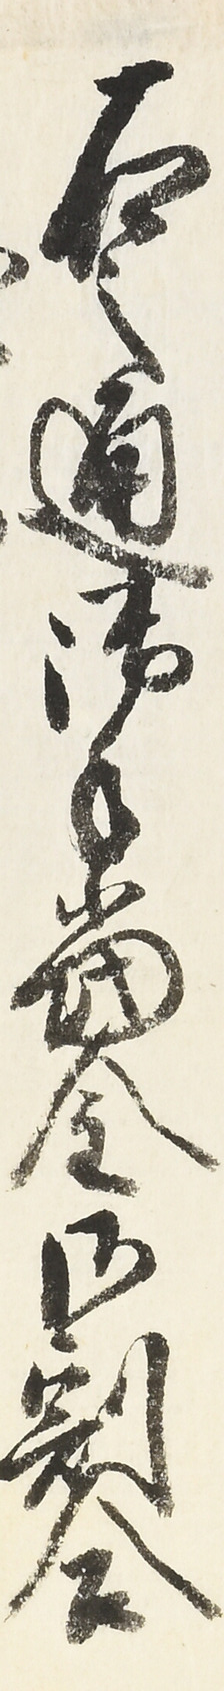右之通御手当金御割合
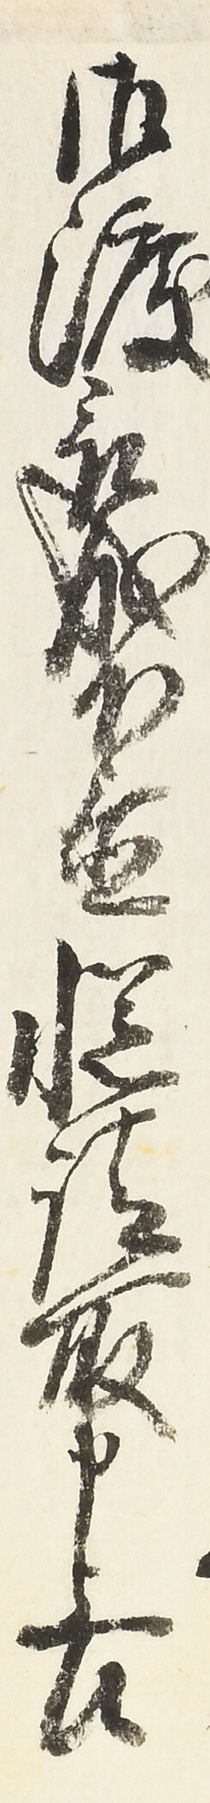御渡被成下置慥請取申上候
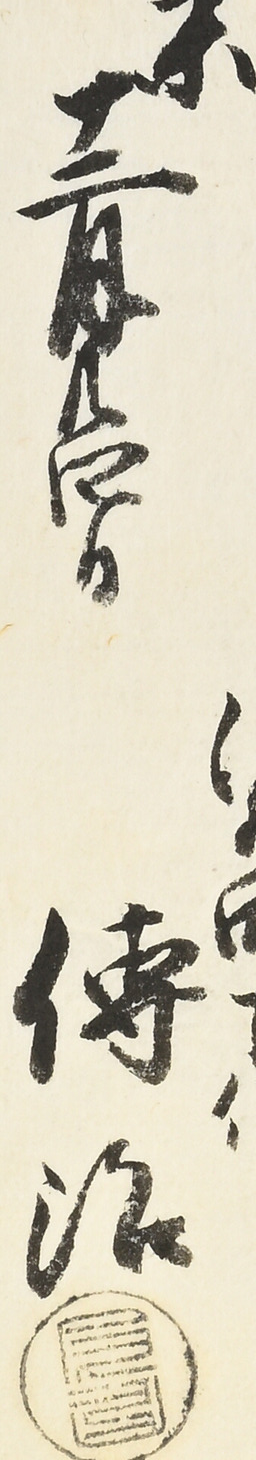十二月廿四日伝治

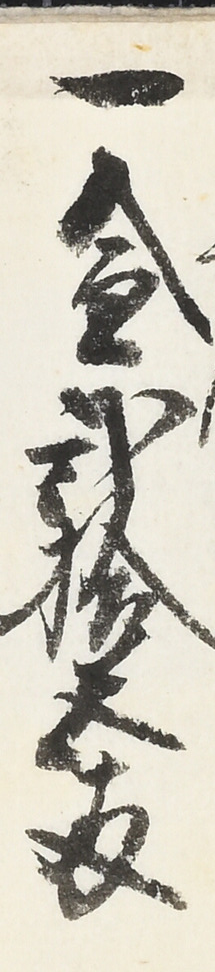一金弐拾五両
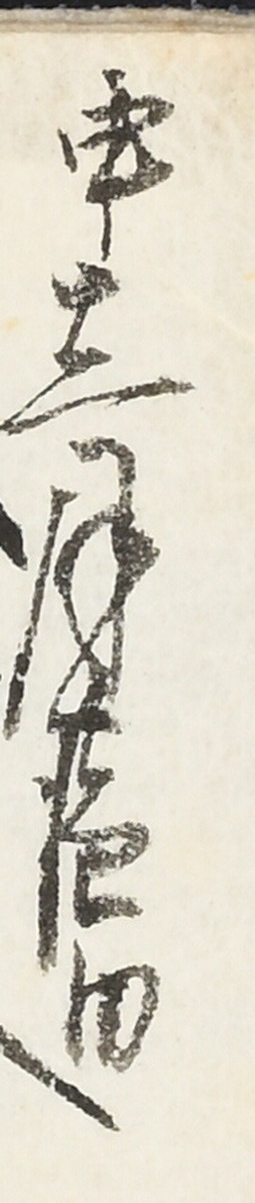申十二月廿四日
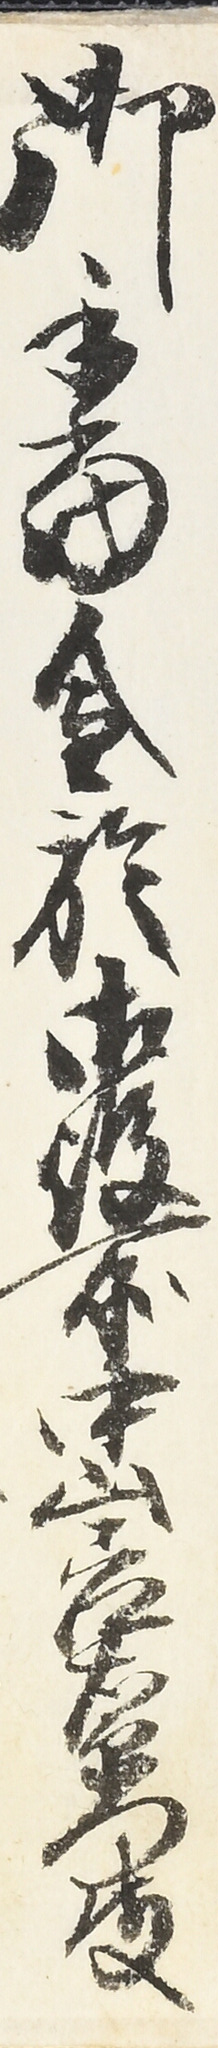御手當金於御役所中山吉右衛門殿
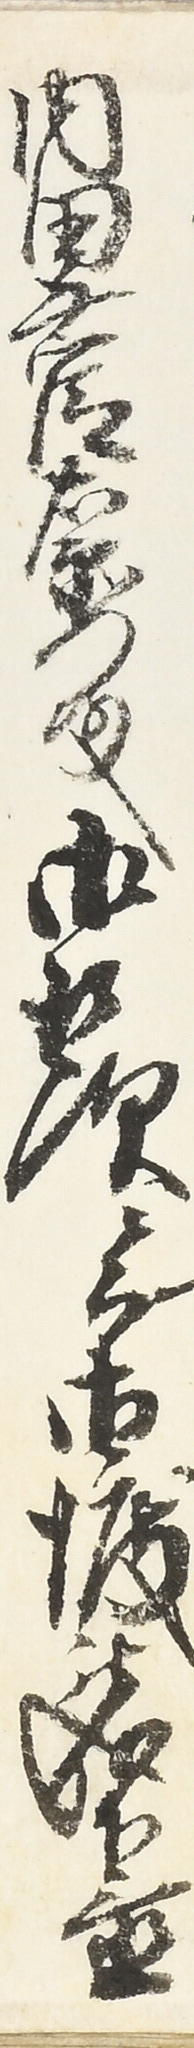内田菅右衛門殿御取次ニ而御渡被成下置
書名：御才覚金御利足割渡扣帳
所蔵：伊那市立高遠町図書館・合同会社AMANE
